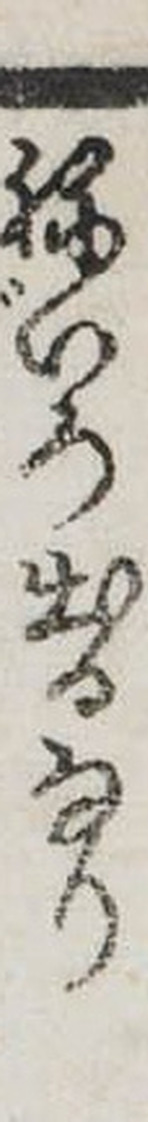ねいろ出るなり
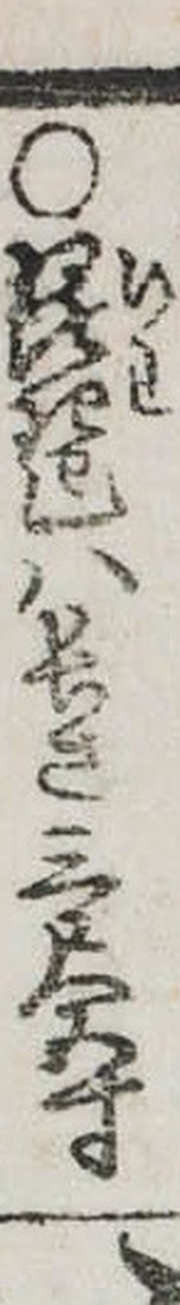○琵琶は長さ三尺五寸
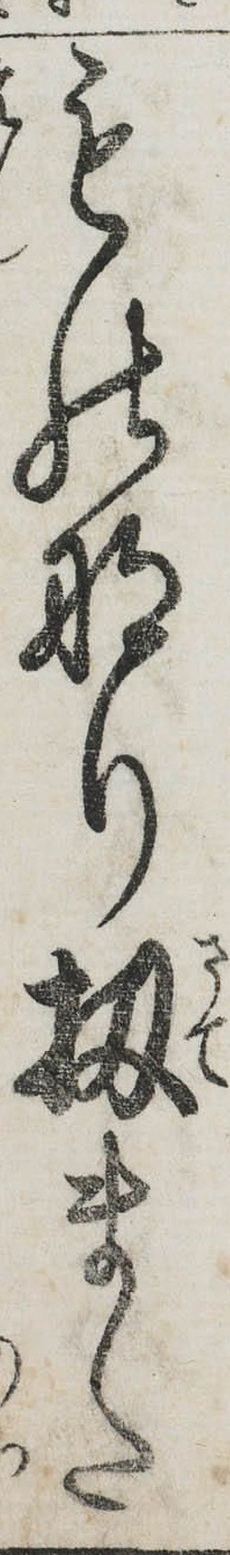ものなり扨また
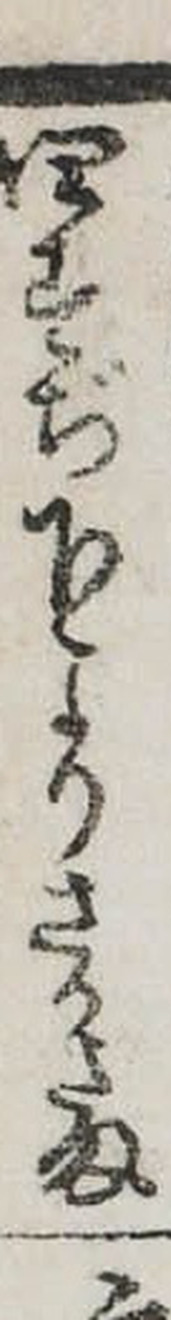四すぢ下よりさかさま
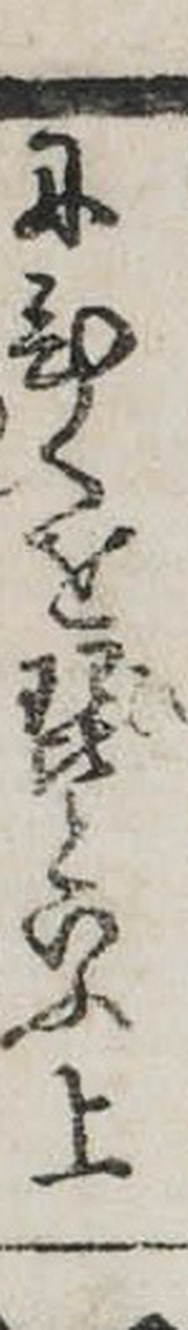にひくを琵といふ上
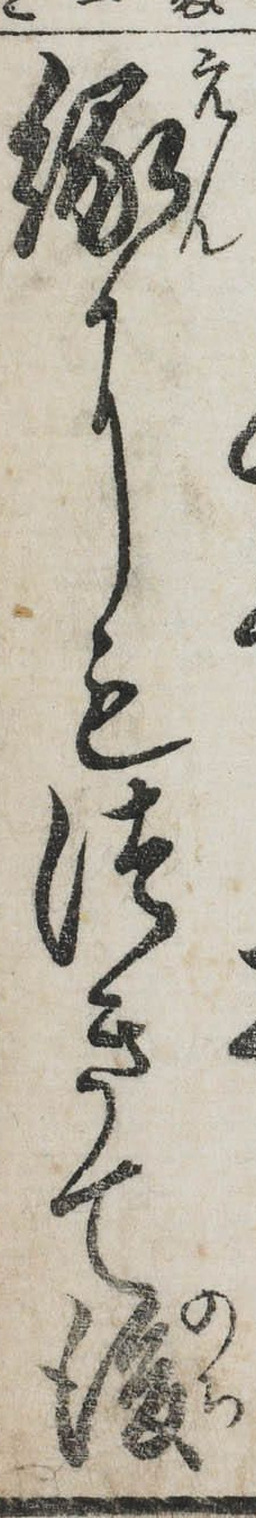縁にもつきて後
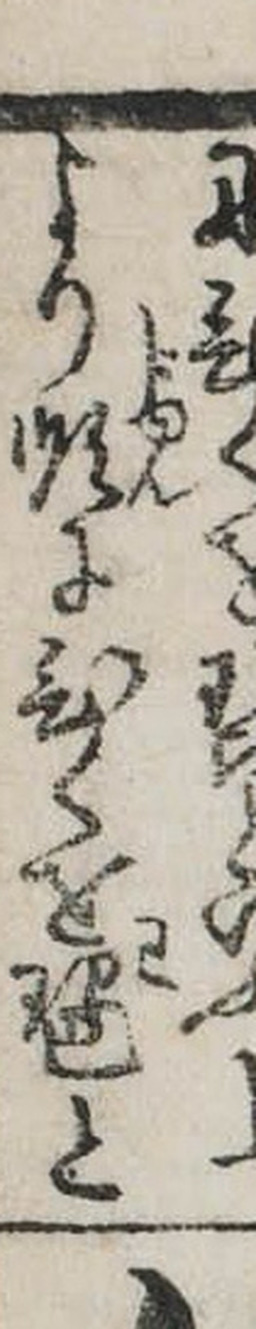より順にひくを琶と

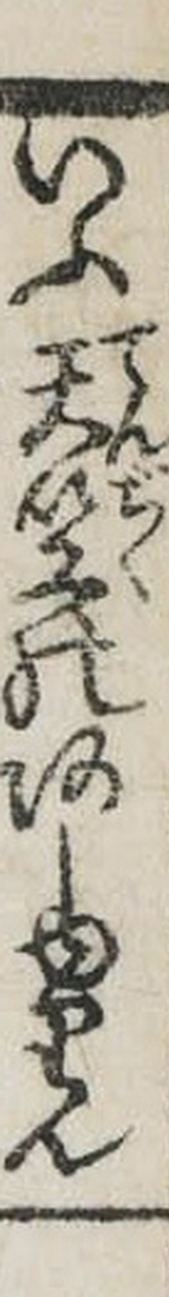いふ天竺のあしゆりん
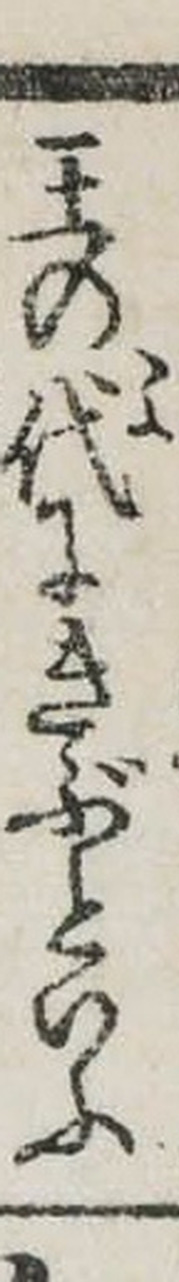王の代にきぶといふ
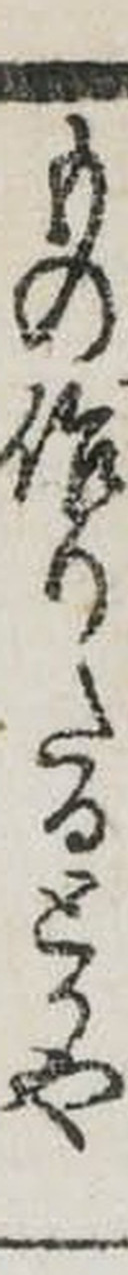もの作りたるとかや
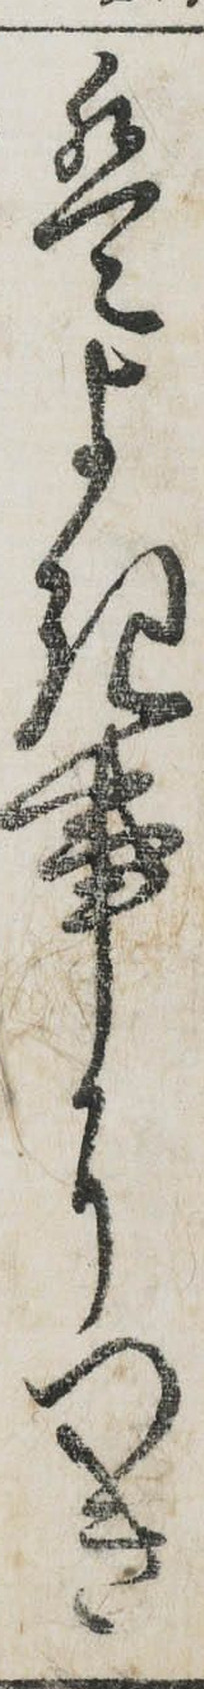はよき事につき
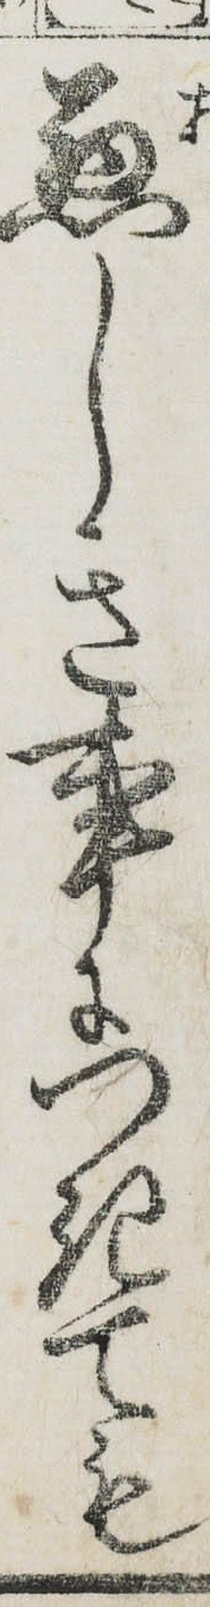悪しき事につきても
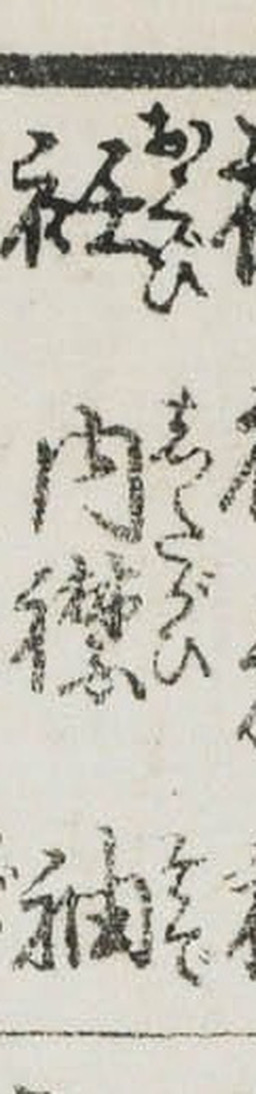衽内襟袖
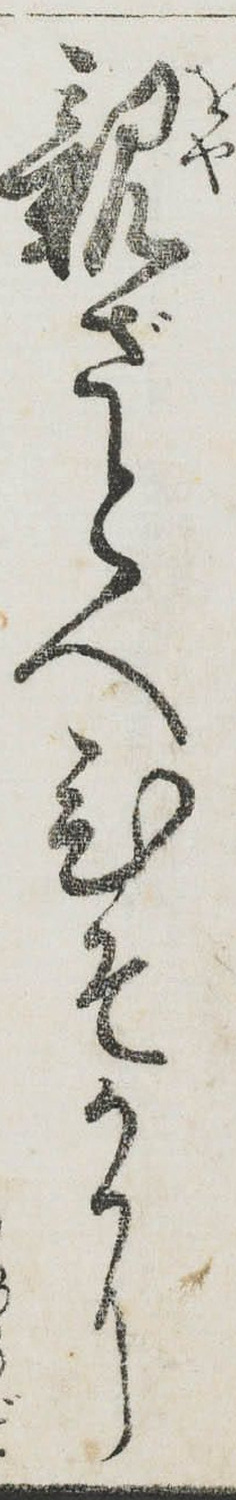親ざとへひそかに
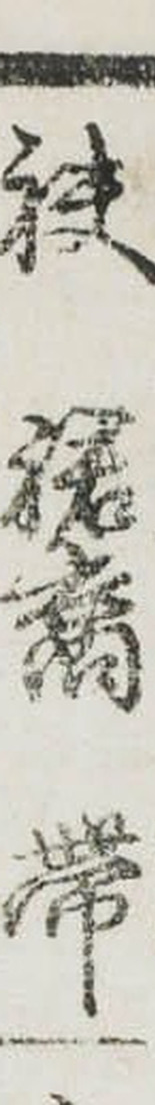袂裙裔帯
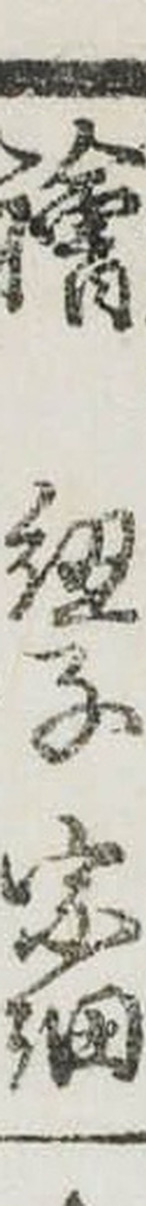襘紐子宗細
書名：頭書萬用婦人手紙之文言
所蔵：東京学芸大学教育コンテンツアーカイブ
